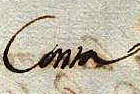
Conta
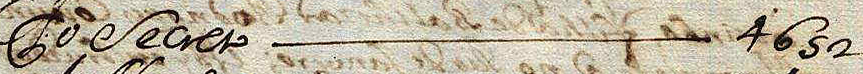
Do Secreto 4652
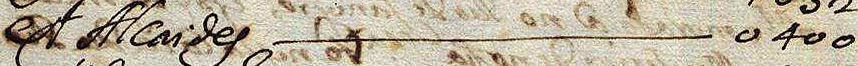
A Alcaides 0400
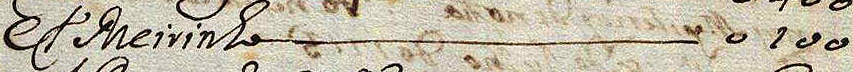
et̄ Meirinho 0100
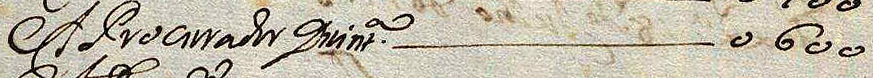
A Procurador Quint.a 0600
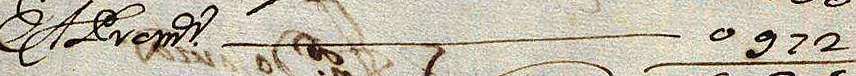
A Promor. 0972
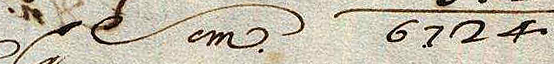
Sem 6724
